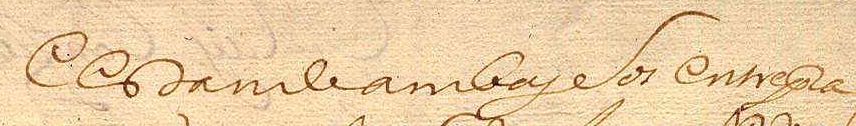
E Estando ambas Sos entre pRa
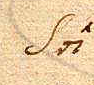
Sós
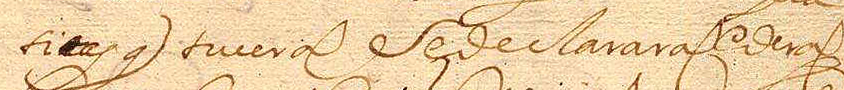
ticas q̄ tiueraꝭ se declararaꝭ e deraꝭ
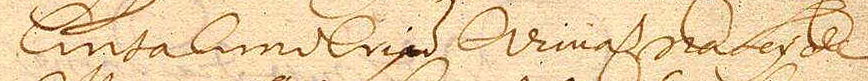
Conta Como Criaõ E viuiaꝭ na Ley de
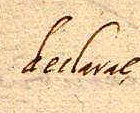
declaraç
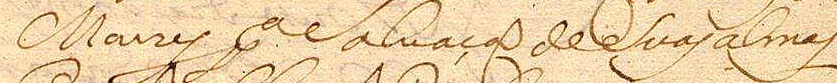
Moizes pa Saluaçaꝭ de suas almas
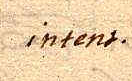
intent.
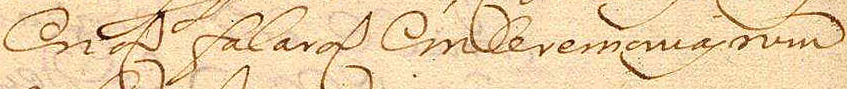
E naꝭ falaraꝭ Em Ceremonias nem
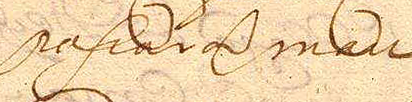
passaraꝭ mais
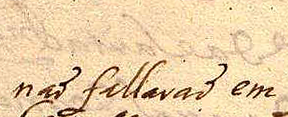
naõ fallaraõ em
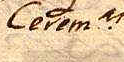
Cerem.as
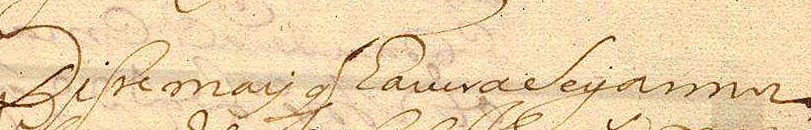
Disse mais q̄ hauera Seis annos
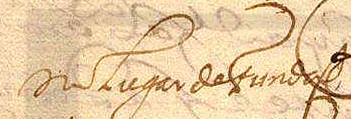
no Lugar de Fundaꝭ
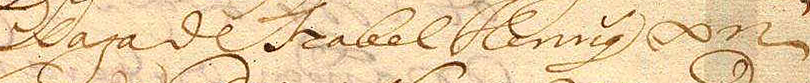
Caza de Izabel Henriqs xn
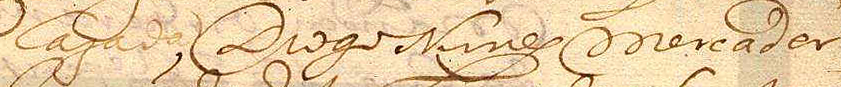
Cazada, Diogo Nunes mercador
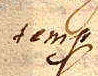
temp
